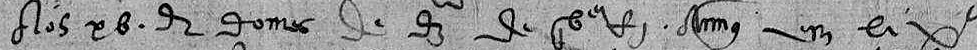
Aos xb. di do mes de dezro de j̄bc Rj. Annꝯ em lixa
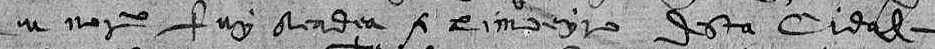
eu notro fuy A cadea e limoeyro desta Cidade
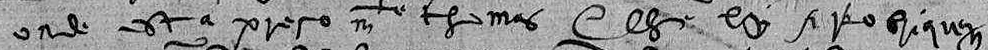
onde esta preso mte thomas e lhe ly e pobriquey
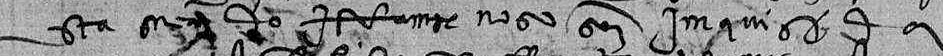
esta snçā do Jffamte noso s̄or Jmquisydor
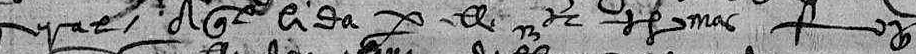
geral / A q̄l lida ꝑ elle mte thomas foy
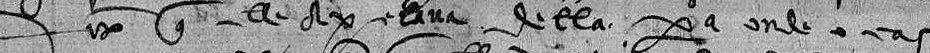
dito q̄ elle Apelaua della ꝑa onde o caso
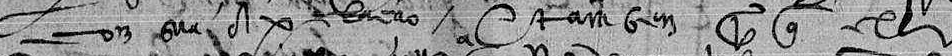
com sua Apelação / e tambem p̄o q̄ elle
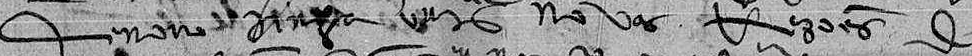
de nouo tinha outas novas Rezoẽs de
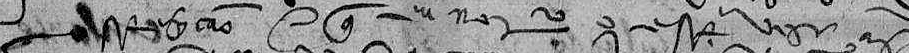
sospeyção e q̄ eu notro o espevese asy
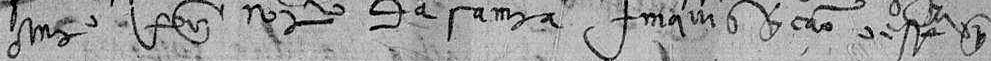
Anto Roīz notro da samta Jmquisyção o espevy
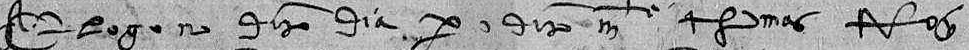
E logo no dito dia ꝑ o dito mte thomas ffoy
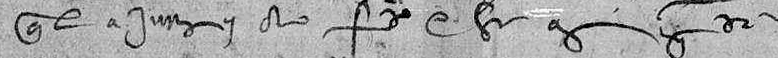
a q̄l aJuntej Ao fto e he a segte
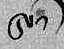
sor̄
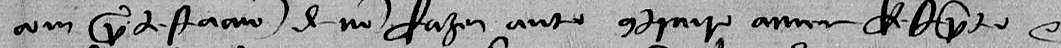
com p̄otestaçaõ de nō fazer auto ꝯtrairo a meu Restp̄to e
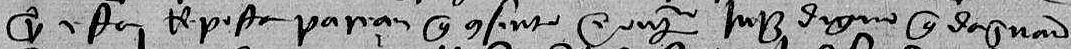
p̄o esta Reposta parecer q̄ ꝯsento ē outro Jujz diguo q̄ da snçā
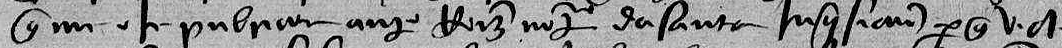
q̄ me oJe pubricou anto Roiz̄ notro da santa Jnq̄siçaõ ꝑ q̄ V. A.
